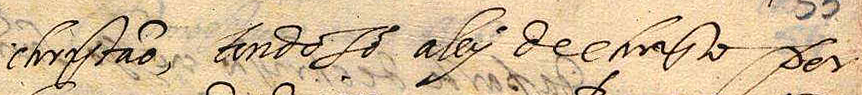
christaõ, tendo só a ley de christo per
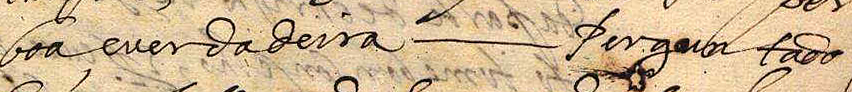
boa e uerdadeira - Perguntado
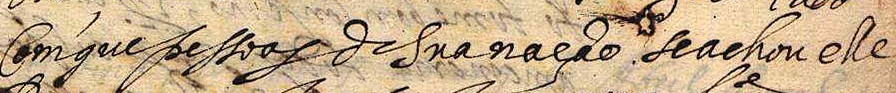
Com que pessoas de sua naçaõ se achou elle
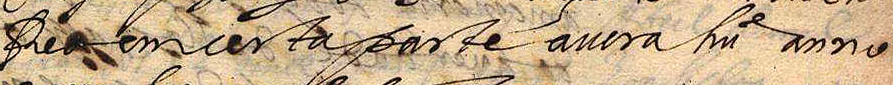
Reo em certa parte auera hū anno
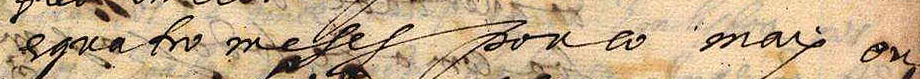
E quatro meses pouco mais ou
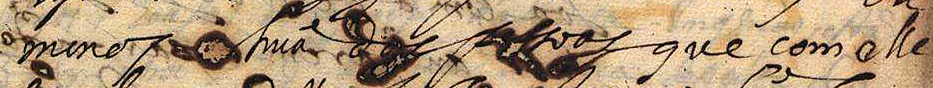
menos _ huā das pessoas que com elle
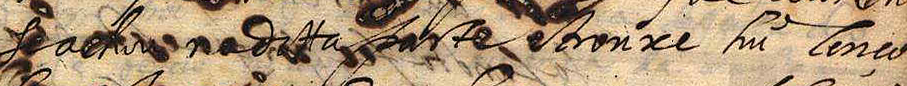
se achou na ditta parte e trouxe hū lenço
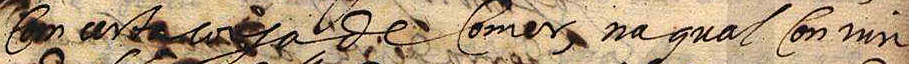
Com certa cousa de Comer, na qual Conuin
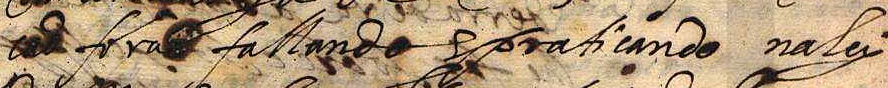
ção foraõ faltando E praticando na Ley
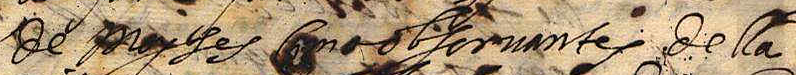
de moyses Como obseruantes della
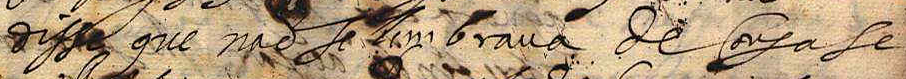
disse que naõ se lembraua de Cousa se
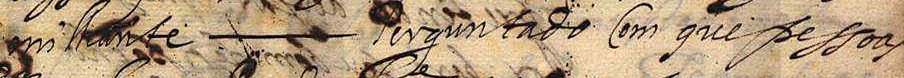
milhante - Perguntado Com que pessoas
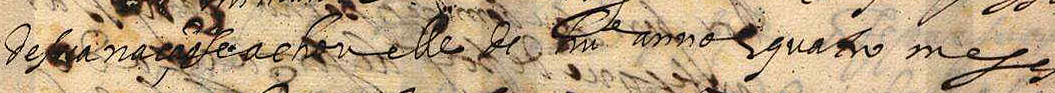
de sua naçaõ se achou elle de hū anno E quatro meses
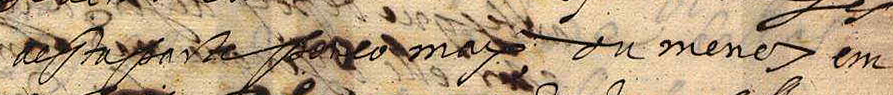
a esta parte poco majs ou menos em
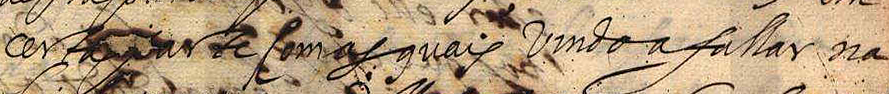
certa parte Com as quais vindo a fallar na
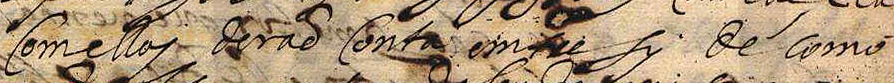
Com ellas deraõ Conta emtre sy de como
